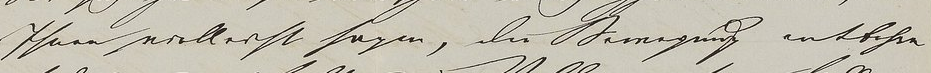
Ihnen vielleicht sagen, die Bewegung entbehre
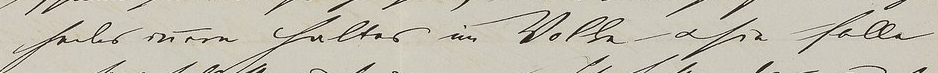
jedes innern Haltes im Volke & sie falle
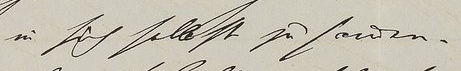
in sich selbst zusammen.
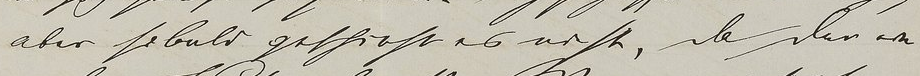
aber sobald geschieht es nicht, da der ein-
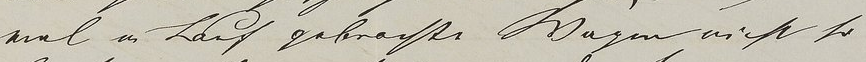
mal in Lauf gebrachte Wagen nicht so
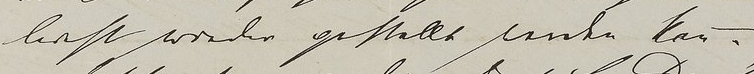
leicht wieder gestellt werden kann.
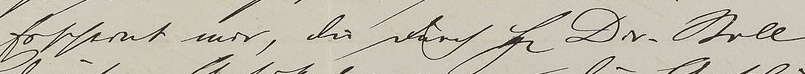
Es scheint mir, die durch Herrn Dr. Stoll
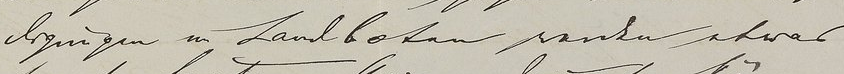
digungen im Landboten werden etwas
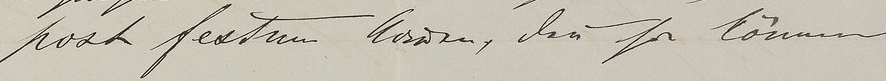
post festum kommen, denn sie können
